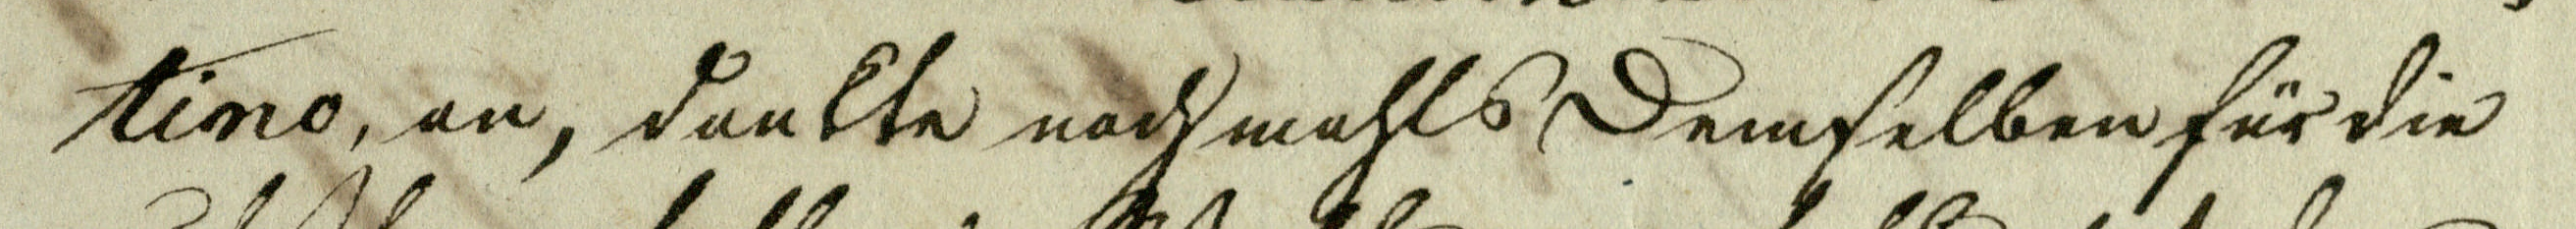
tino, an, dankte nochmahls Demselben für die
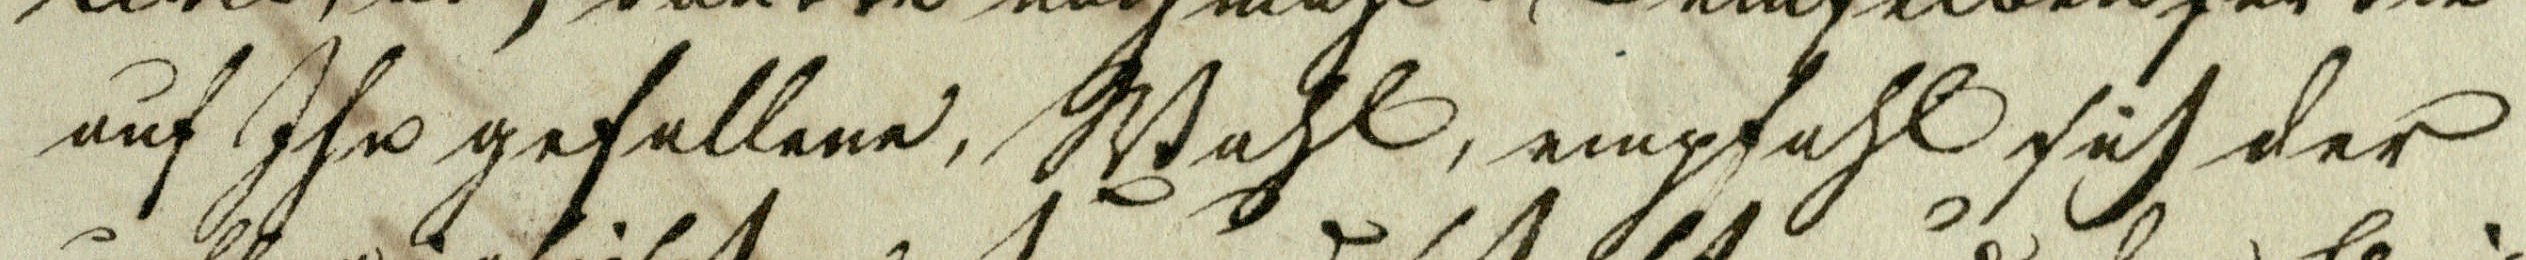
auf Ihn gefallene, Wahl, empfahl sich der
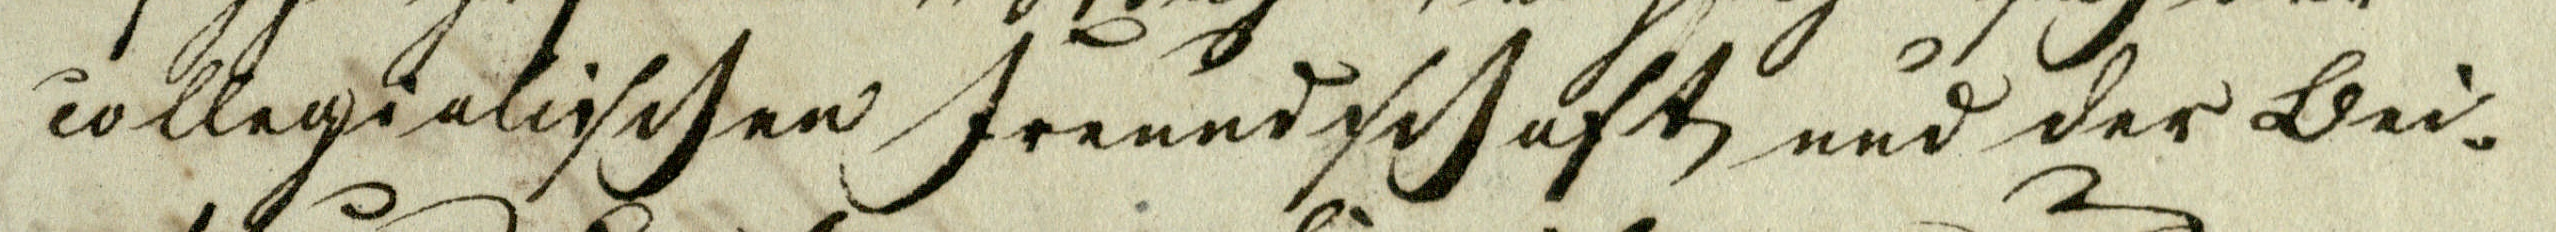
collegianischen Freundschaft und der Bei¬
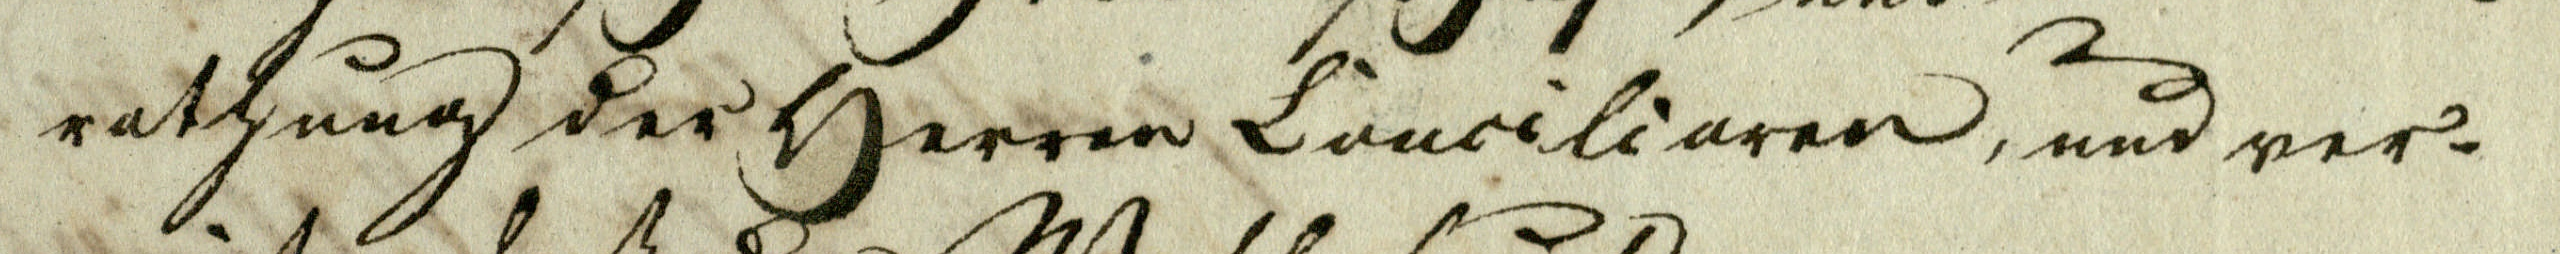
rathung der Herren Conciliaren, und ver¬
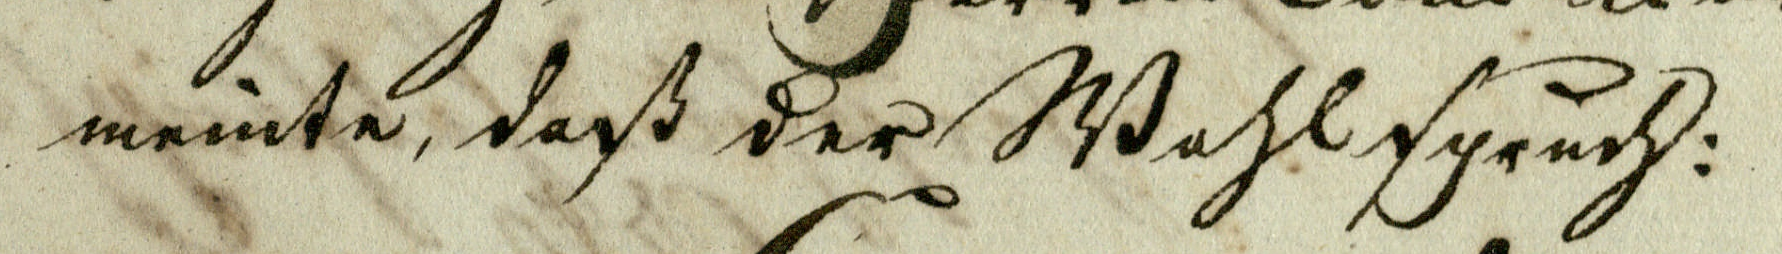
meinte, daß der Wahlspruch¬
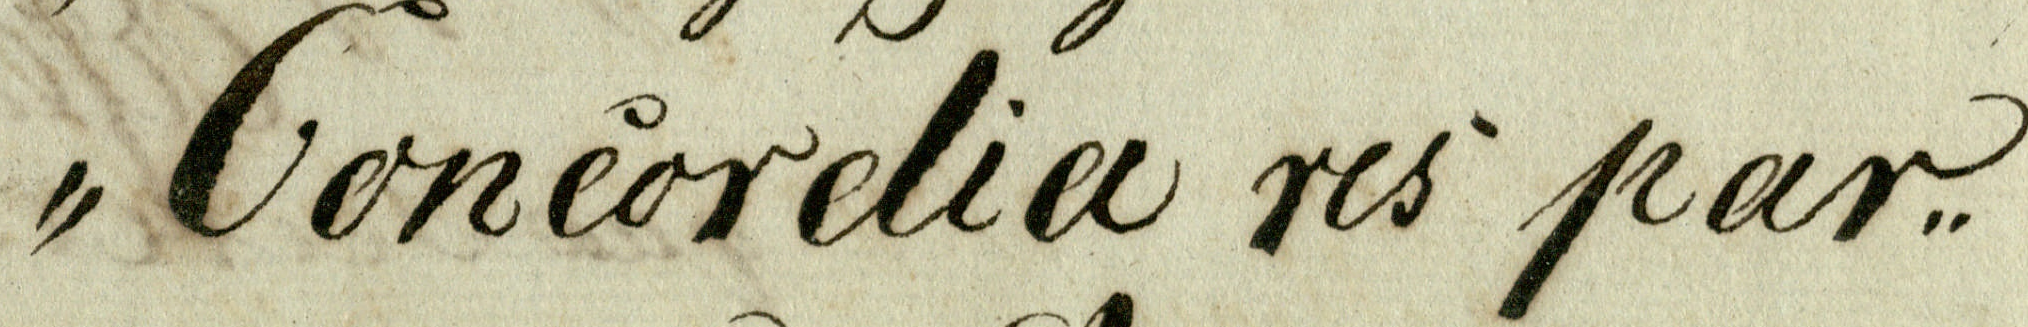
"Concordia res par¬
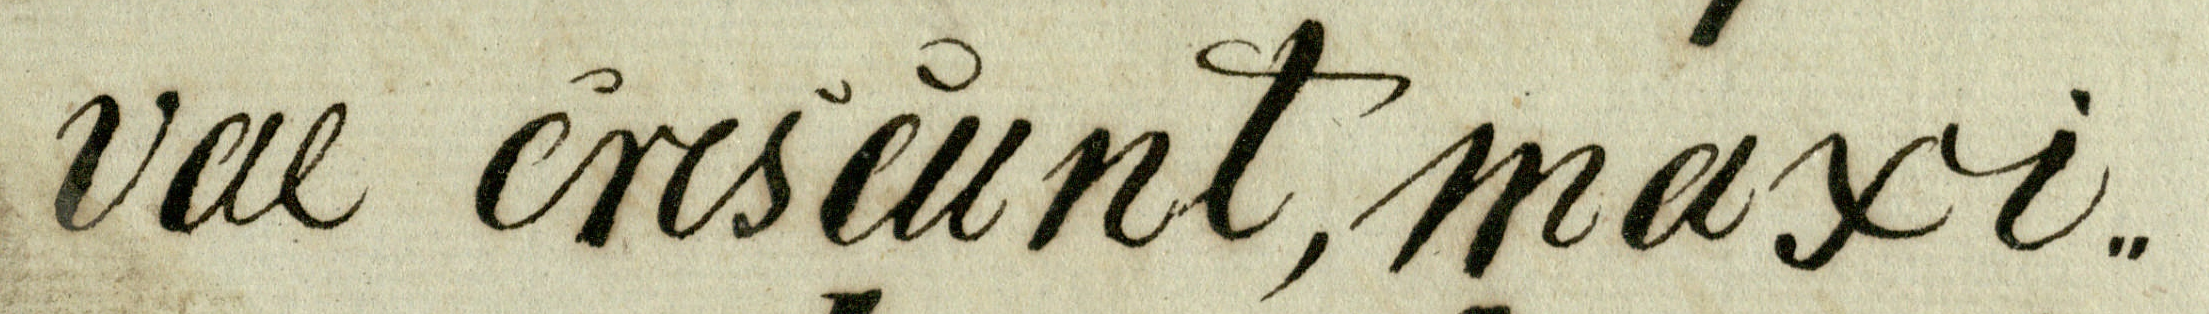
"vae crecunt, maxi¬
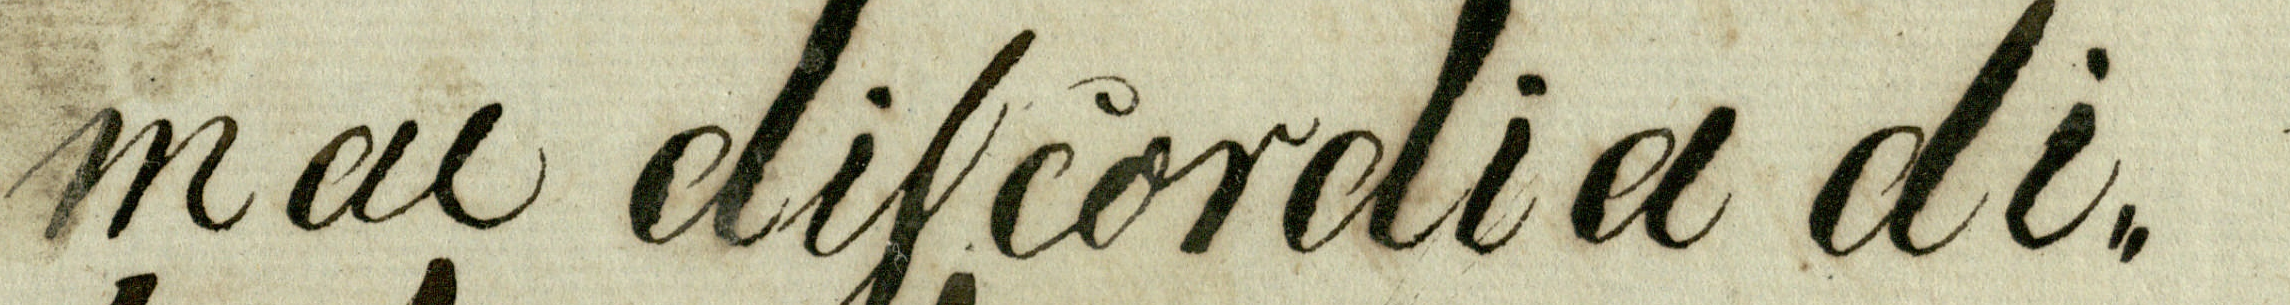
"mae discordia di¬
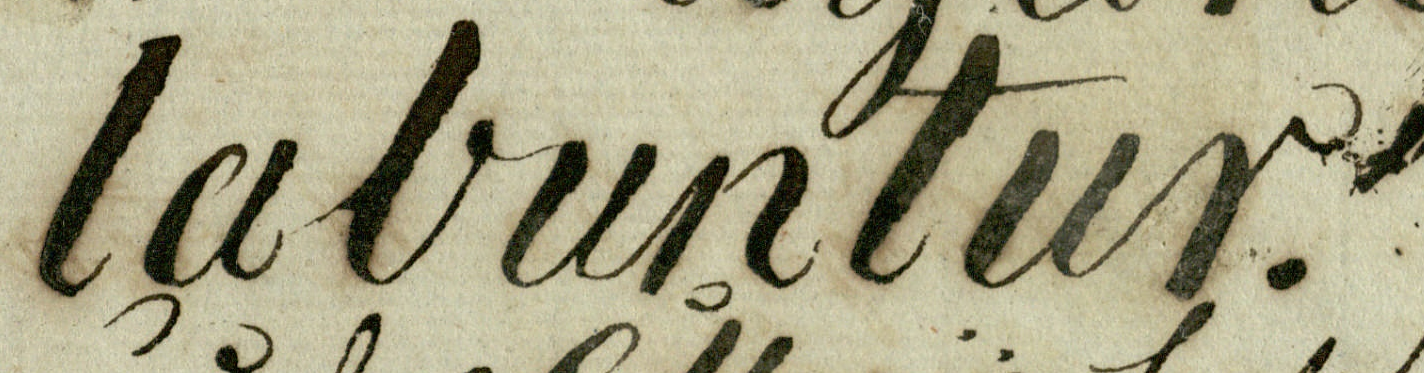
"la buntur."
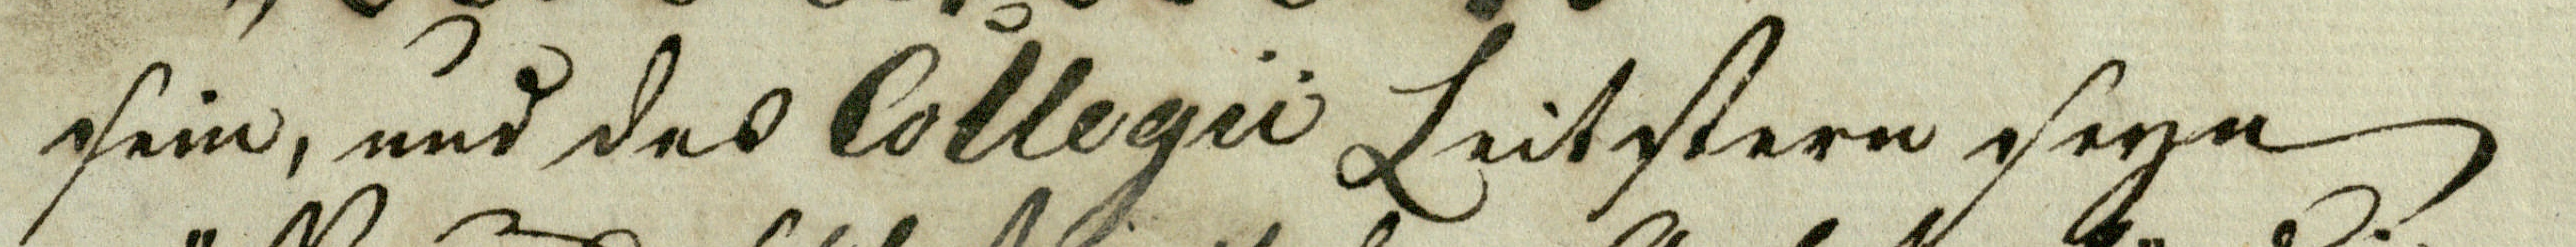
sein, und des Collegii Leitstern seyn
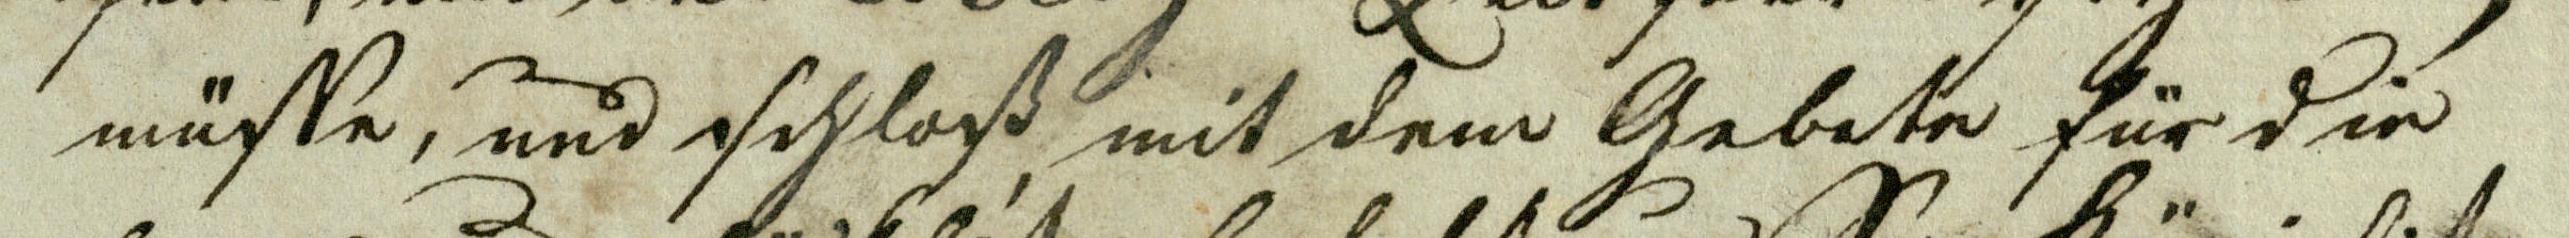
müsse, und schloß mit dem Gebete für die
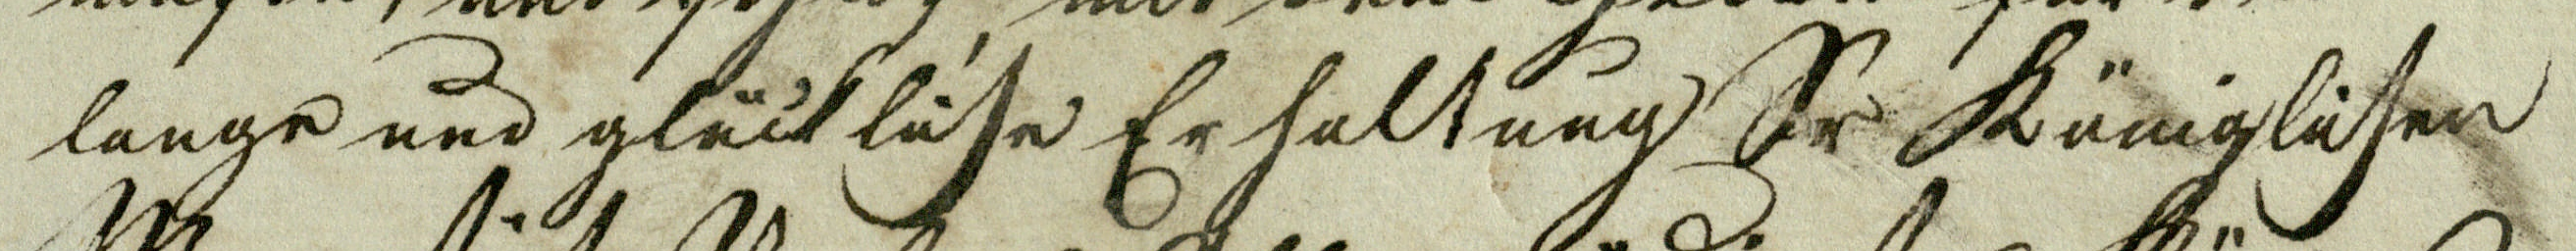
lange und glückliche Erhaltung Sr Königlichen
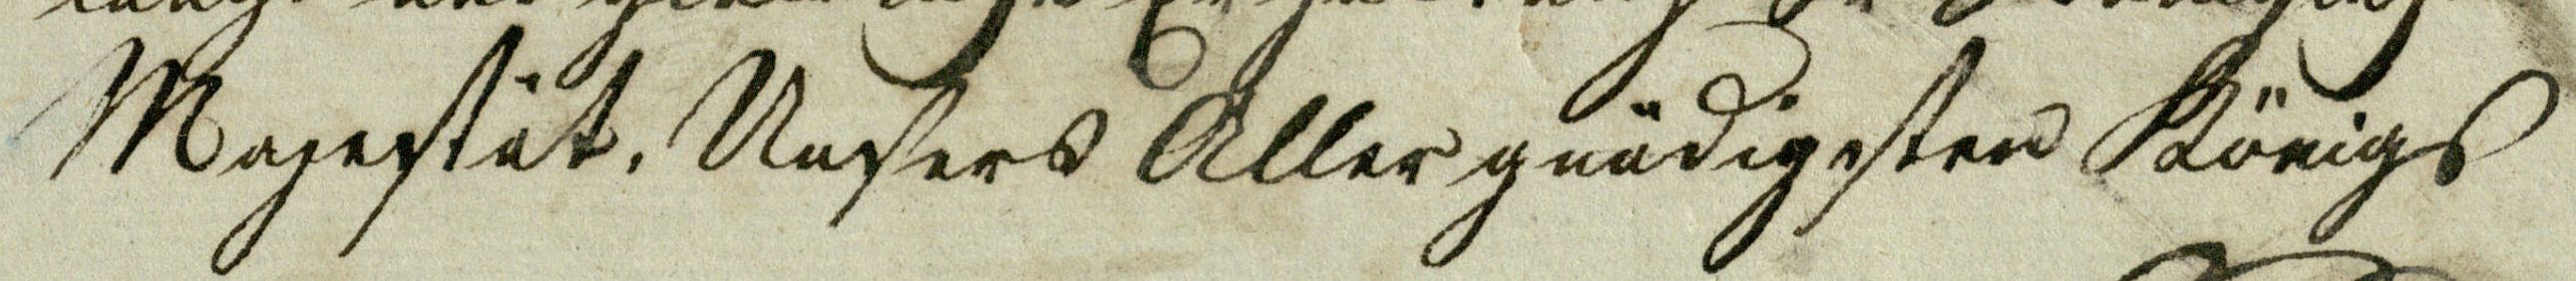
Mayestät. Unsers allergnädigsten Königs
